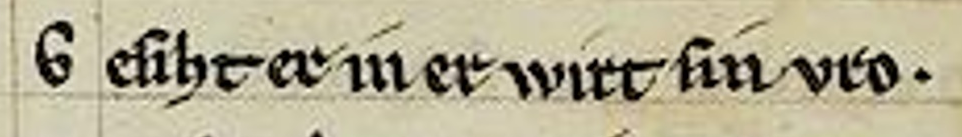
Geſiht er in er wirt ſin vro.
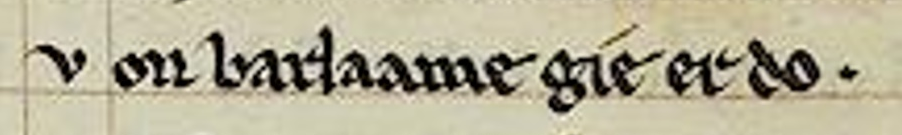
Von barlaame gie er do.
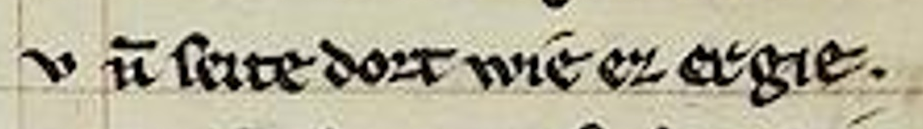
Vn(d) ſeite dort wie ez ergie.
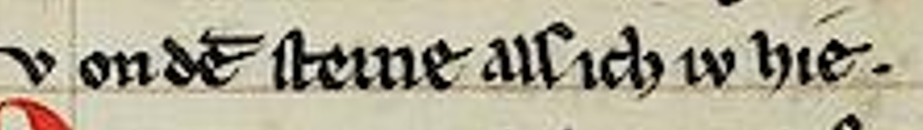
Von de(m) ſteine alſ ich iv hie.
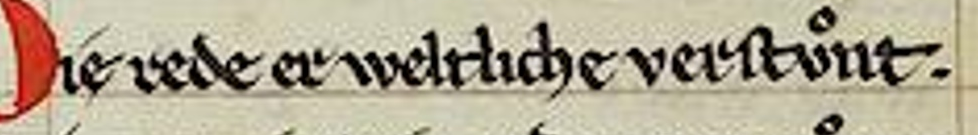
*Die rede er weltiche verſtv°ont.
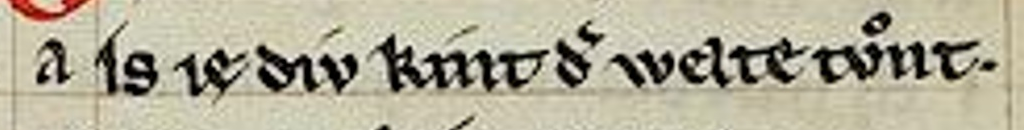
Als ie div kint d(er) welte tv°ont.
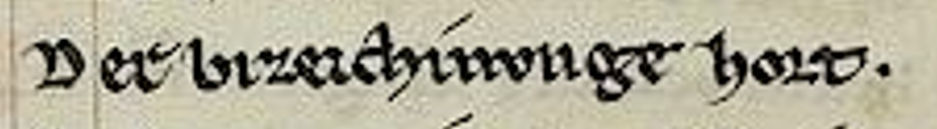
Der bizeichinvnge hort.
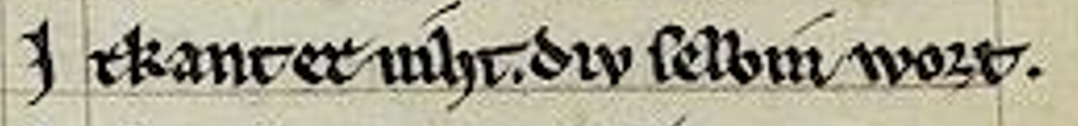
Irkant er niht. div ſelbin wort.
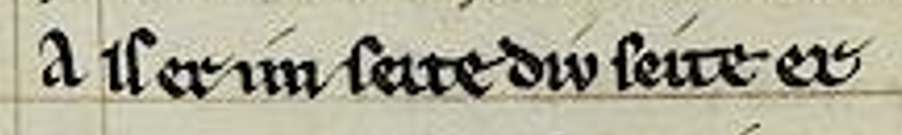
Alſ er im ſeite div ſeite er
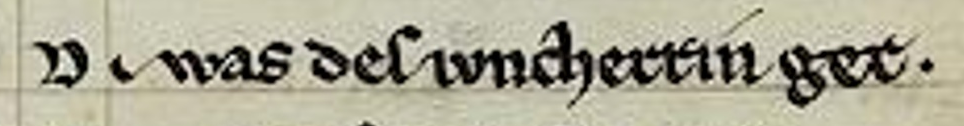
D(az) waſ deſ ivncherrin ger.
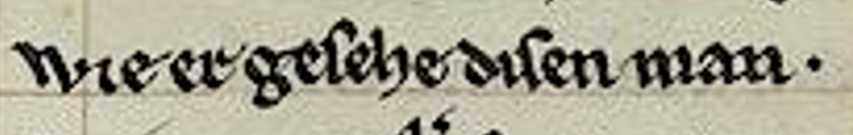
Wie er geſehe diſen man.
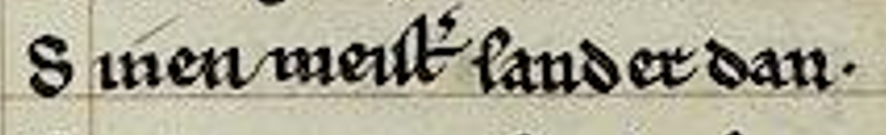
Sinen meiſt(er) ſand er dan.
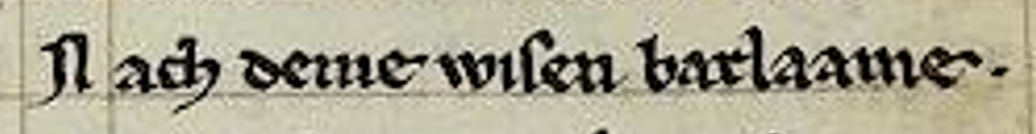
Nach deme wiſen barlaame.
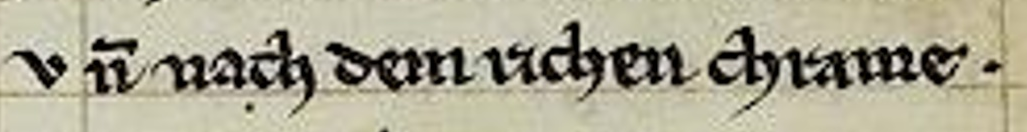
Vn(d) nach dem richen chrame.
